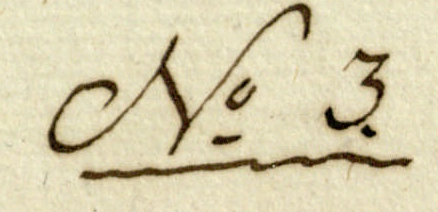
Nº 3.
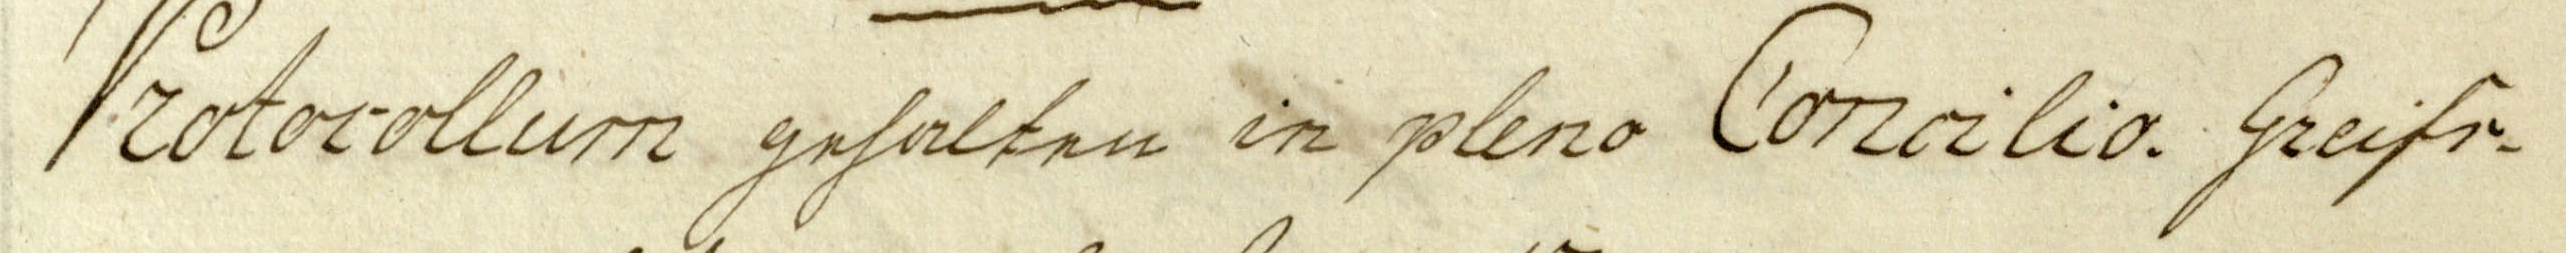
Protocollum gehalten in pleno Concilio. Greifs¬
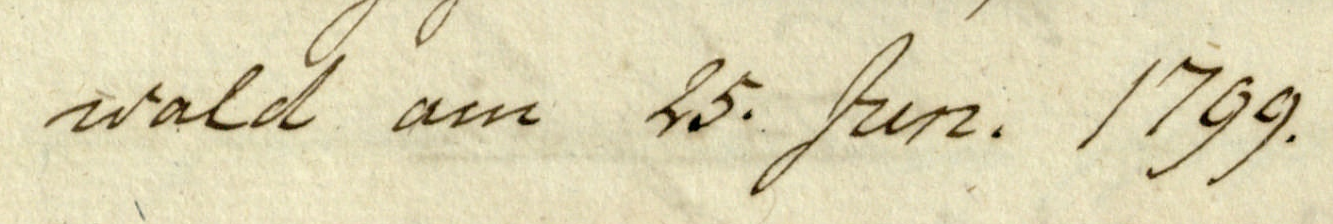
wald am 25. Jun. 1799
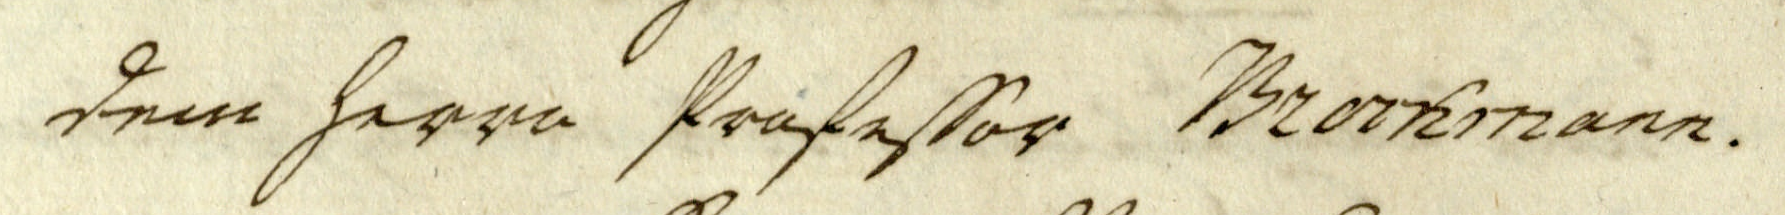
dem herrn Prof. Brockmann.
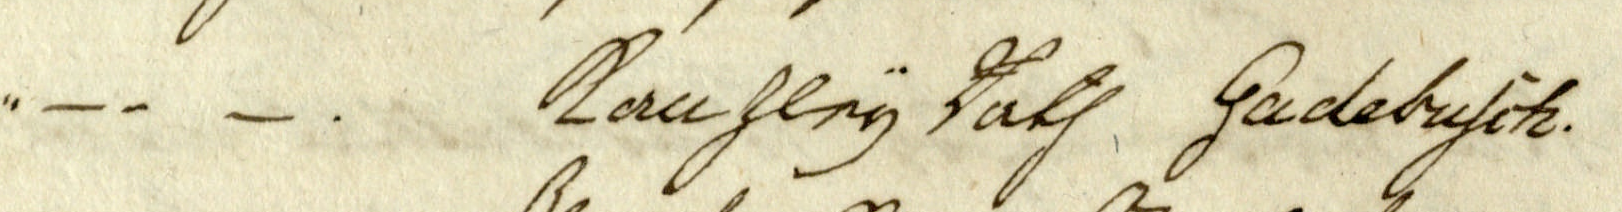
Kanzleÿ Rath Gadebusch.
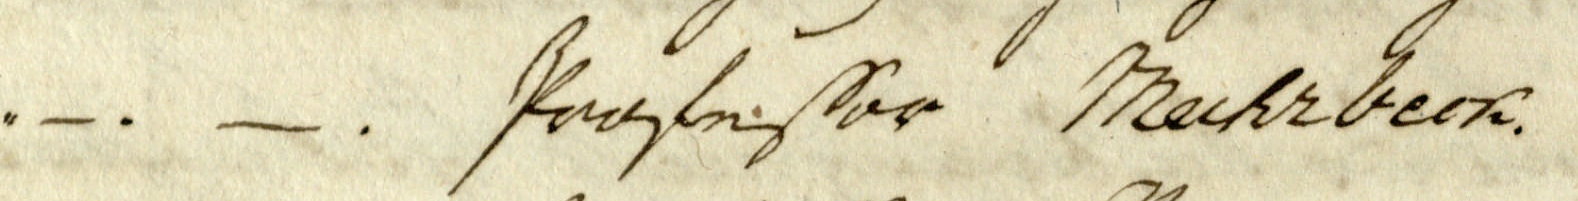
Professor Muhrbeck.
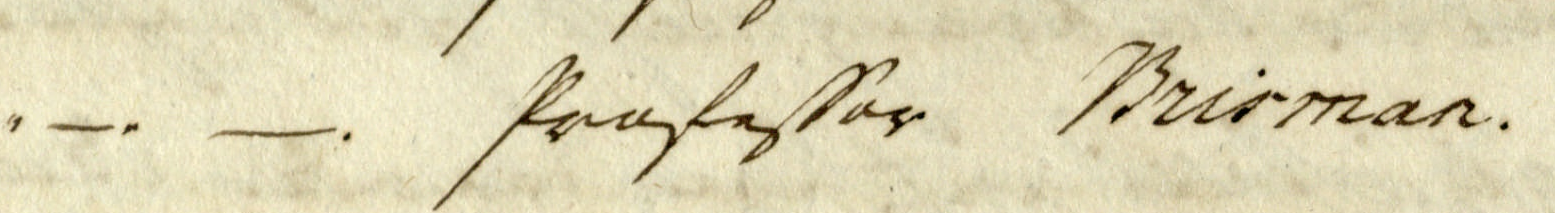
Professor Brisman.
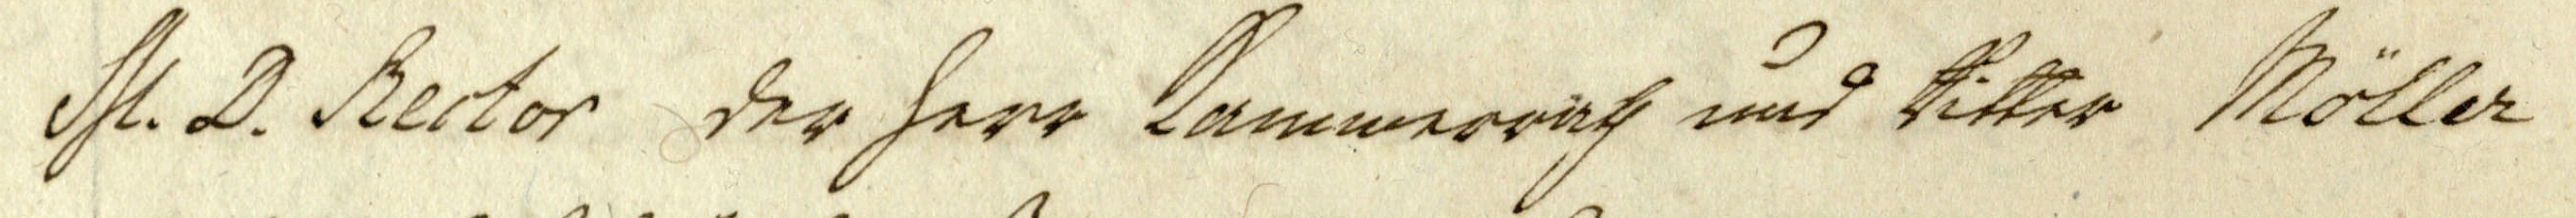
M. D. Rector der herr Kammerrath und Ritter Möller
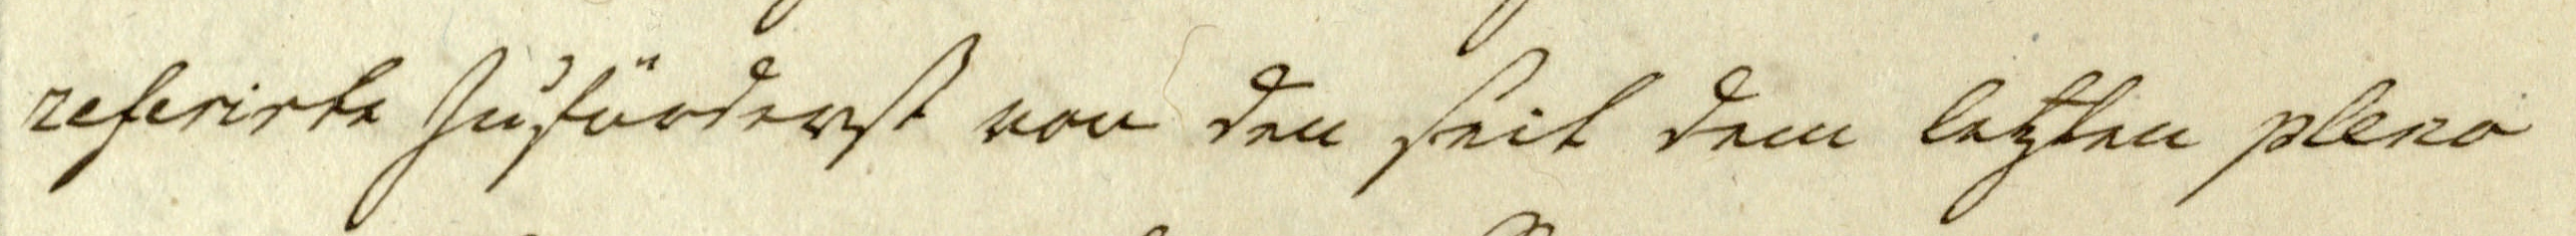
referirte zuförderst von den seit dem letzten pleno
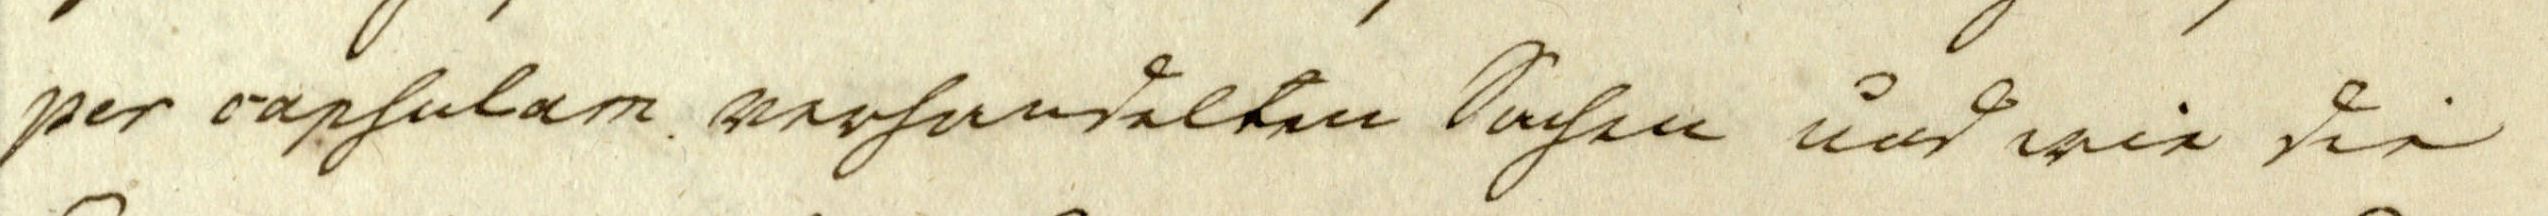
per capsulam verhandelten Sachen und wie die
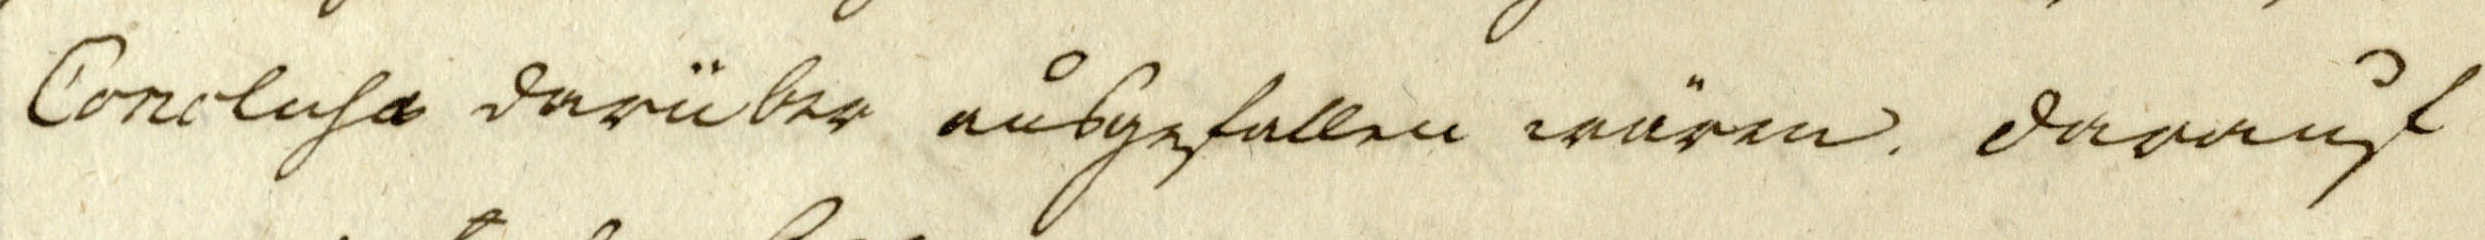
Conclusa darüber ausgefallen wären. Darauf
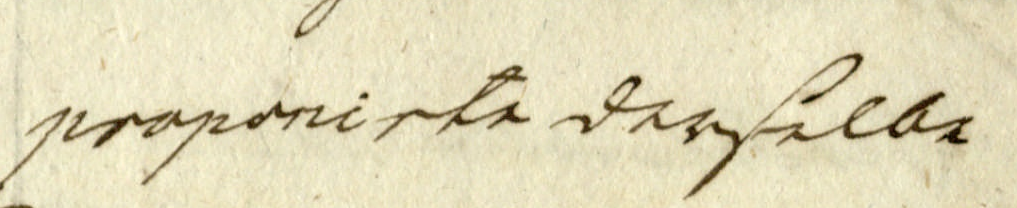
proponirte derselbe
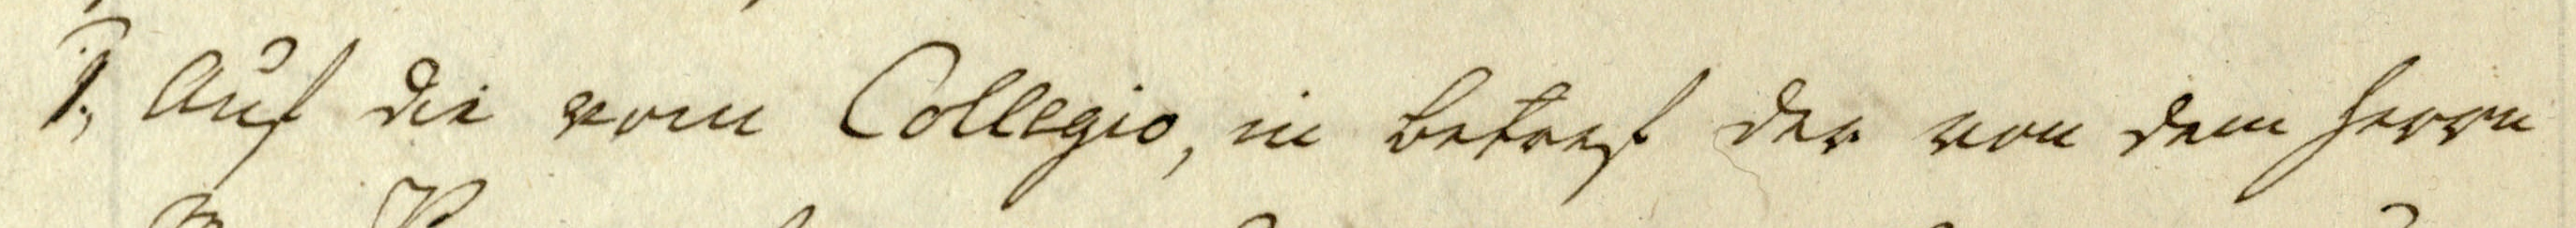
1., Auf die vom Collegio, in Betref der von dem herrn
